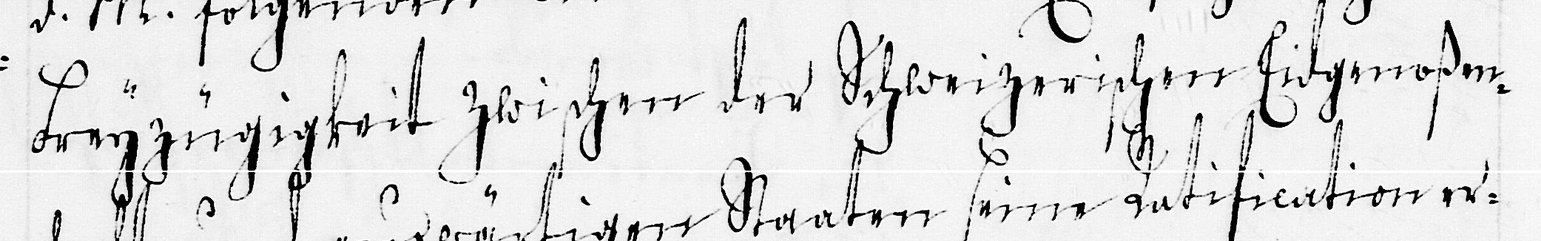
Freyzügigkeit zwischen der Schweizerischen Eidgenoßen¬
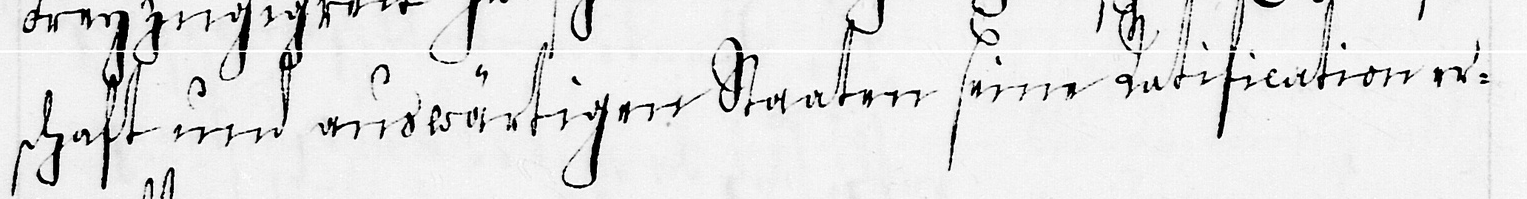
schaft und auswärtigen Staaten seine Ratification er¬
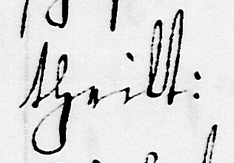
theilt:
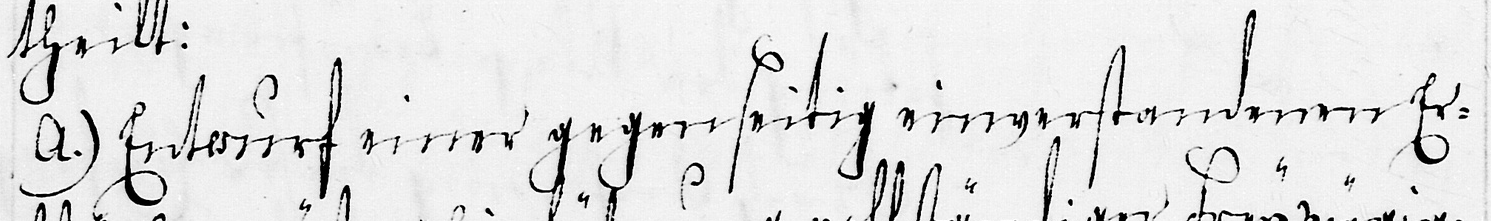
A.) Entwurf einer gegenseitig einverstandenen Er¬
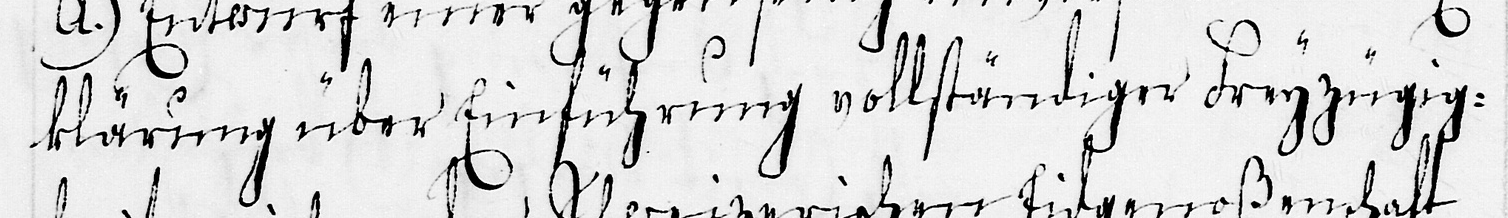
klärung über Einführung vollständiger Freyzügig¬
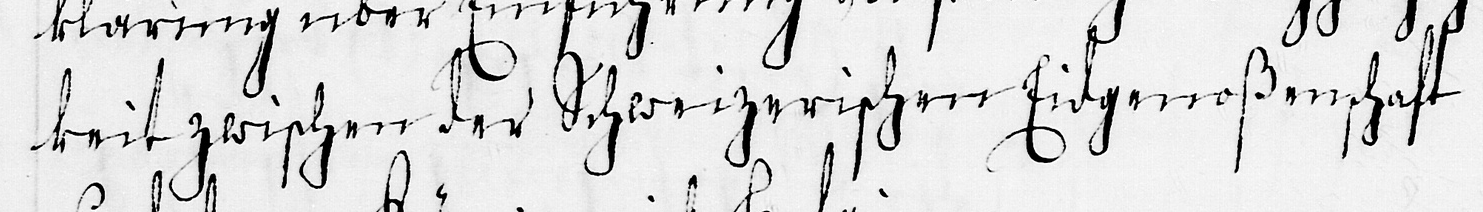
keit zwischen der Schweizerischen Eidgenoßenschaft
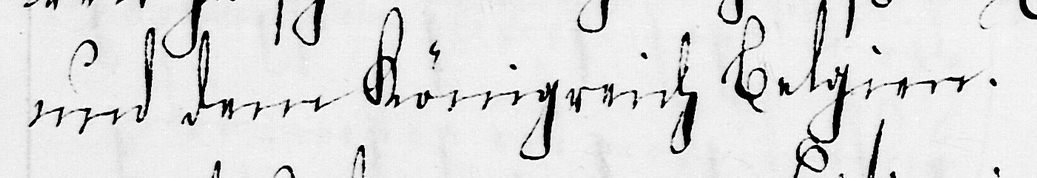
und dem Königreich Belgien.
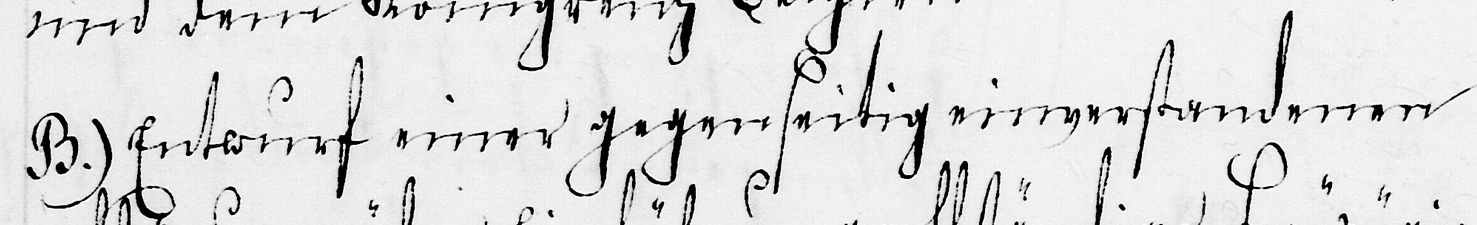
B.) Entwurf einer gegenseitig einverstandenen
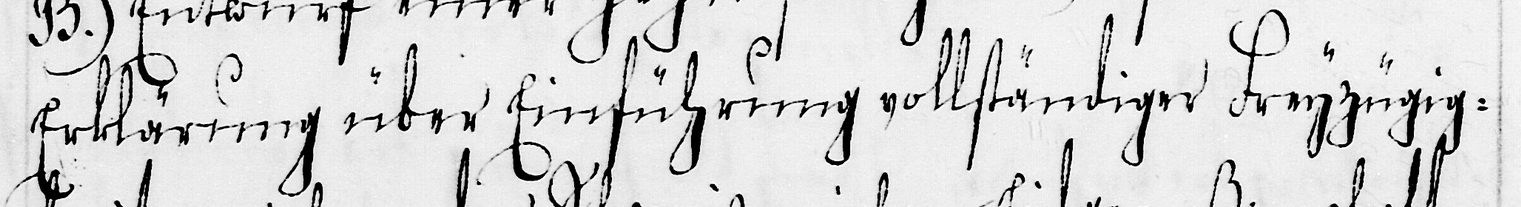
Erklärung über Einführung vollständiger Freyzügig¬
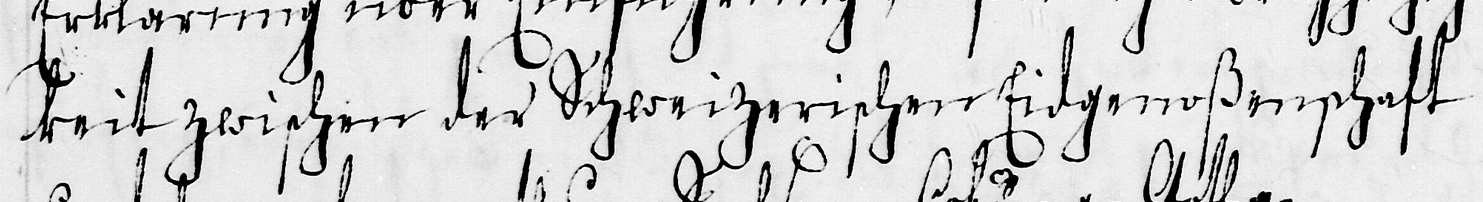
keit zwischen der Schweizerischen Eidgenoßenschaft
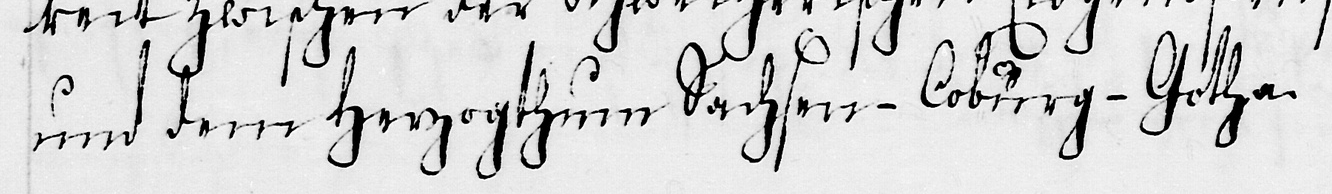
und dem Herzogthum Sachsen-Coburg-Gotha.
